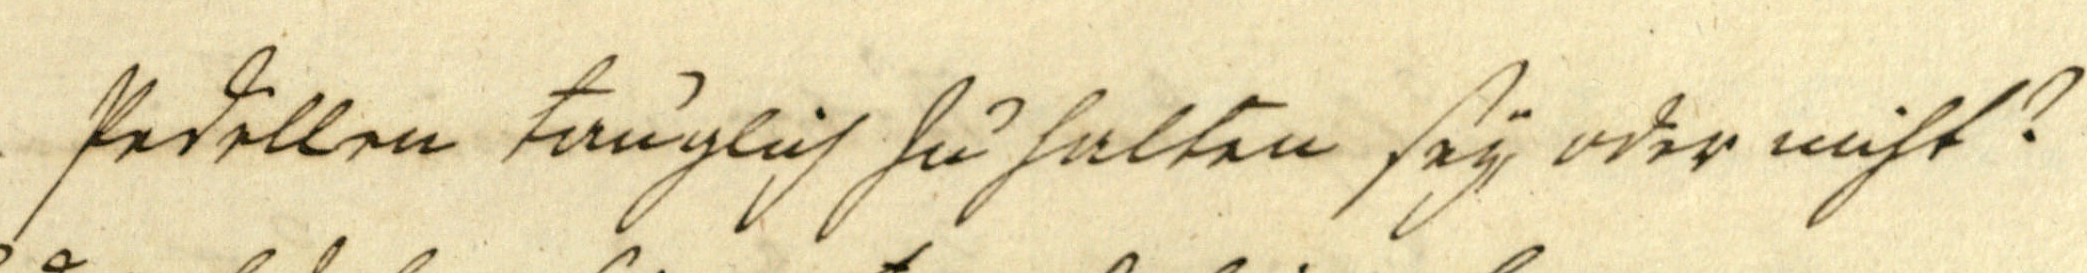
Pedellen tauglich zu halten seÿ, oder nicht?
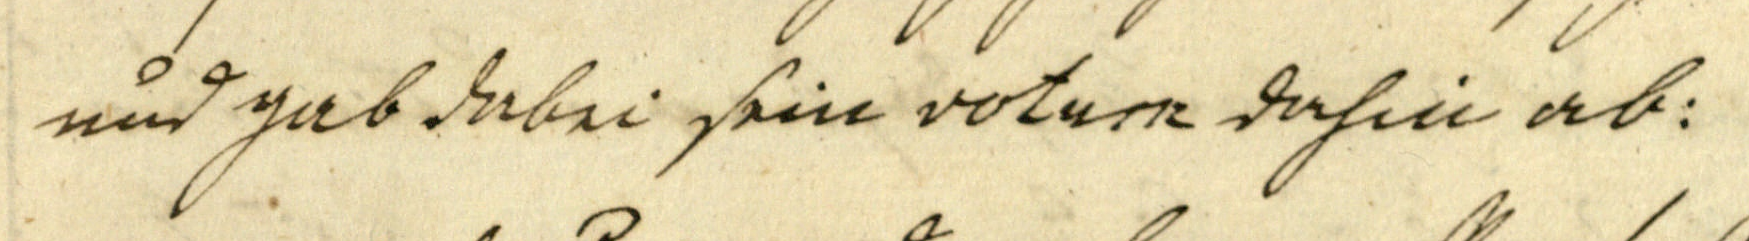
und gab dabei sein votum dahin ab:
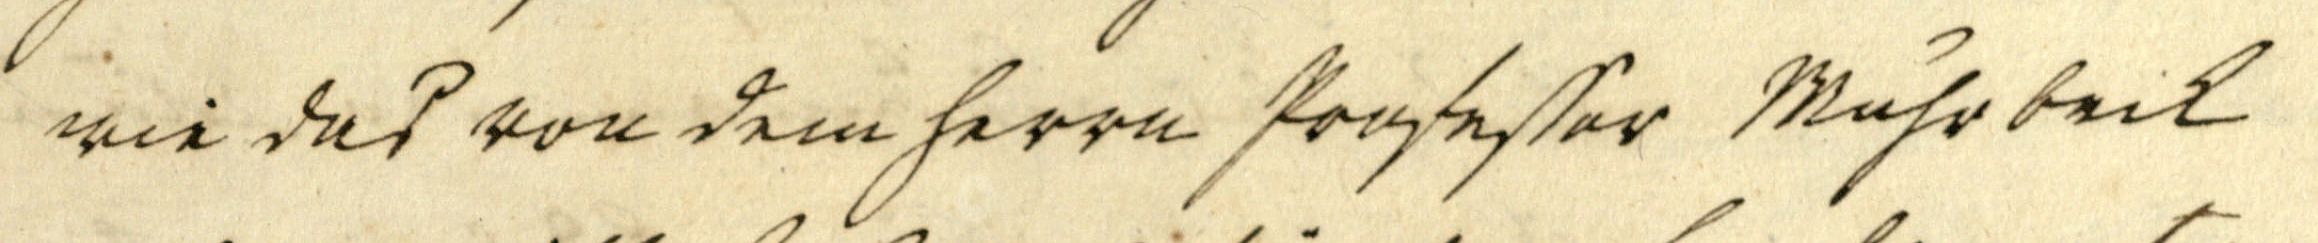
wie das von dem Herrn Professor Muhrbeck
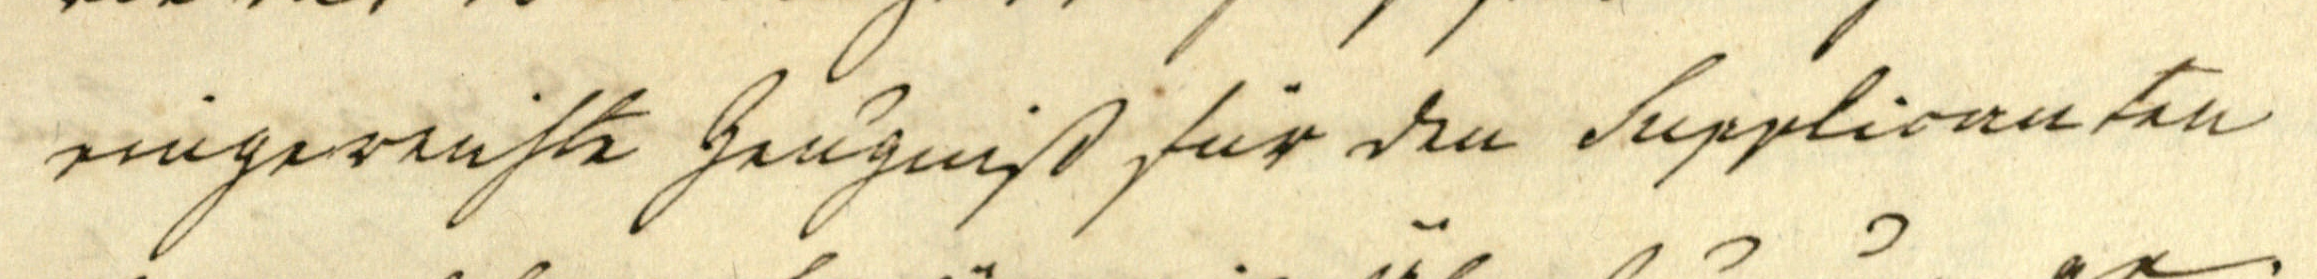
eingereichte Zeugniß für den Supplicanten
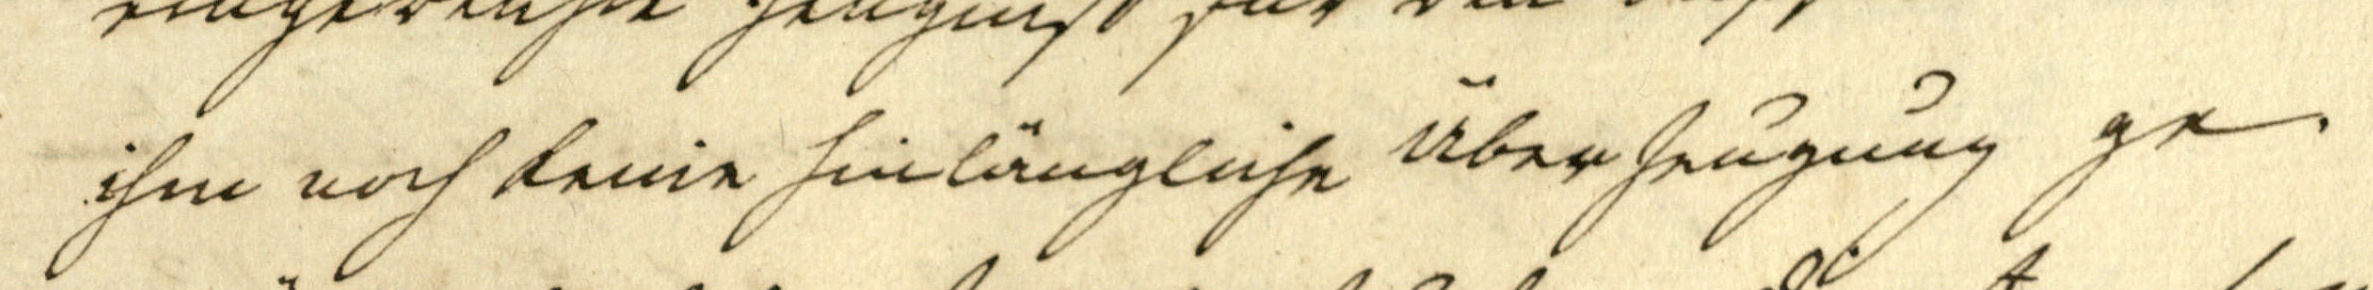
ihm noch keine hinlängliche Überzeugung ge¬
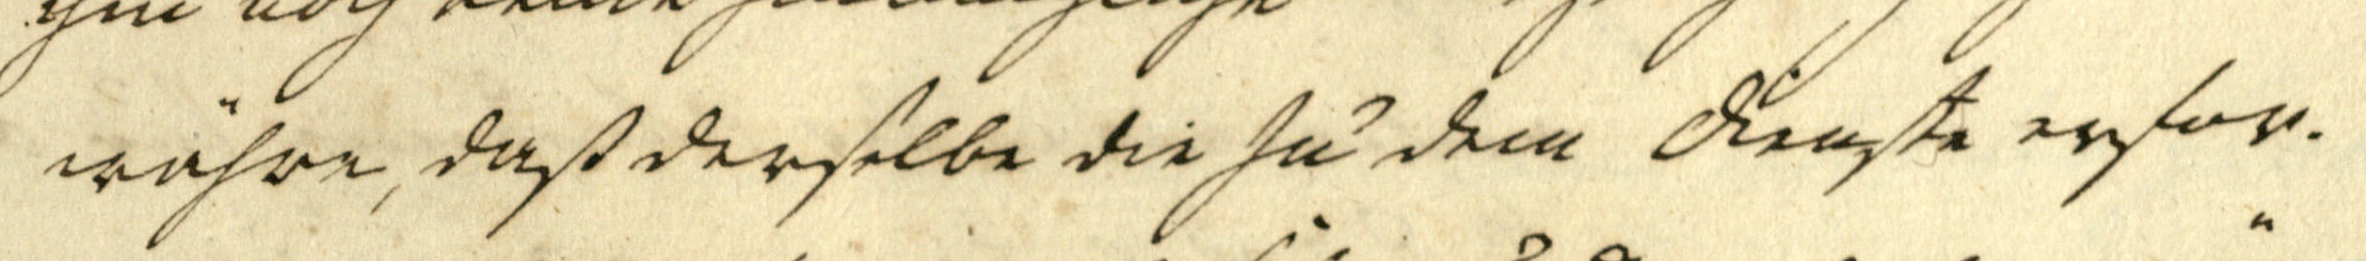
währe, daß derselbe die zu dem Dienste erfor¬
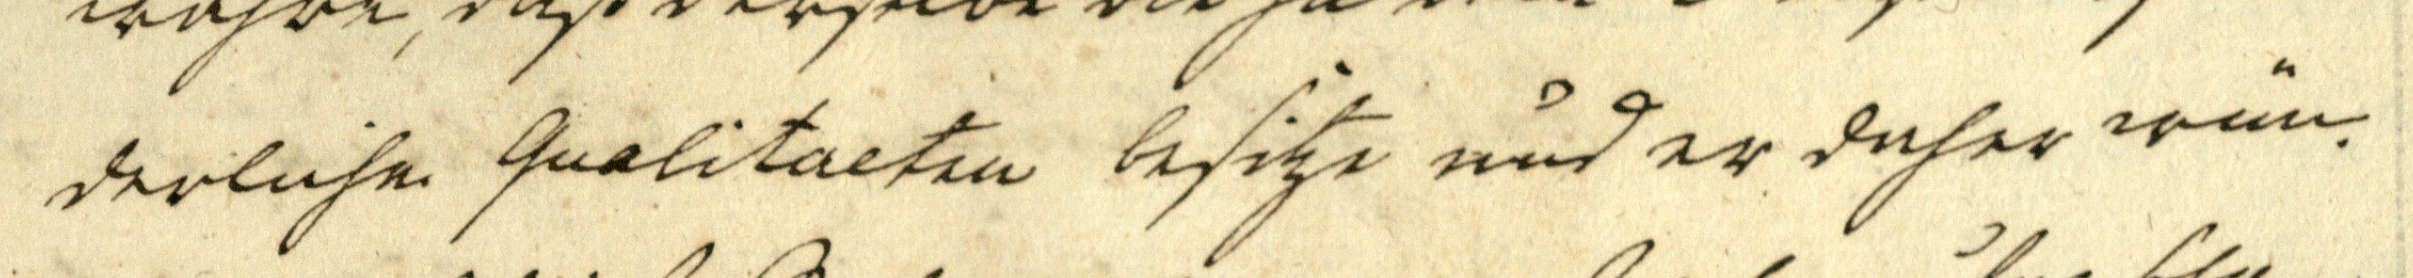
derliche Qualitaeten besitze und er daher wün¬
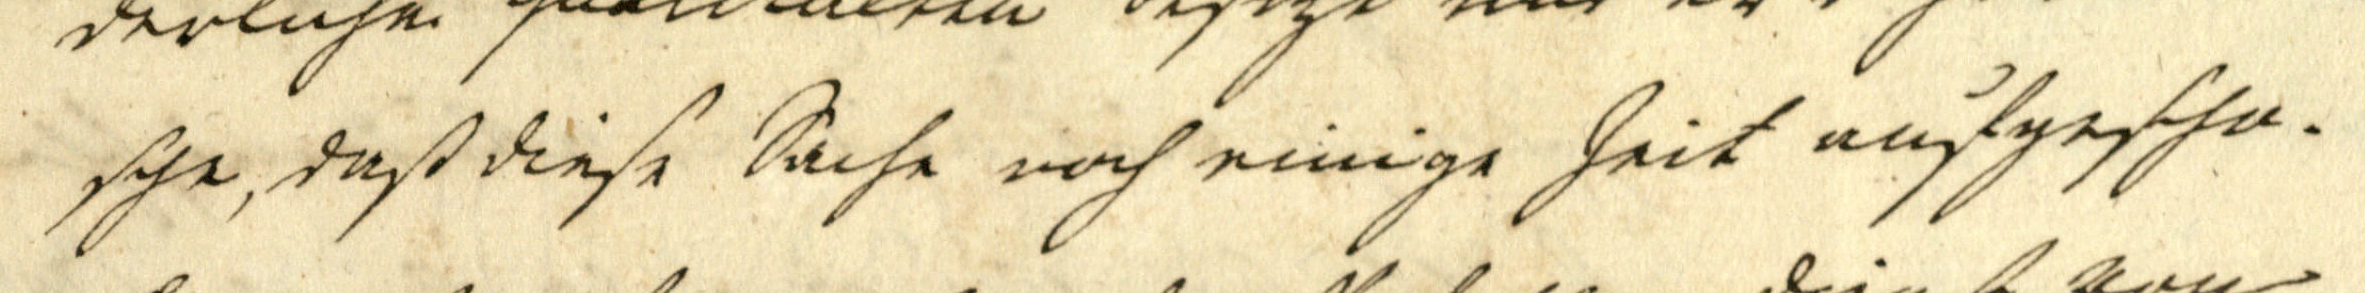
sche, daß diese Sache noch einige Zeit aufgescho¬
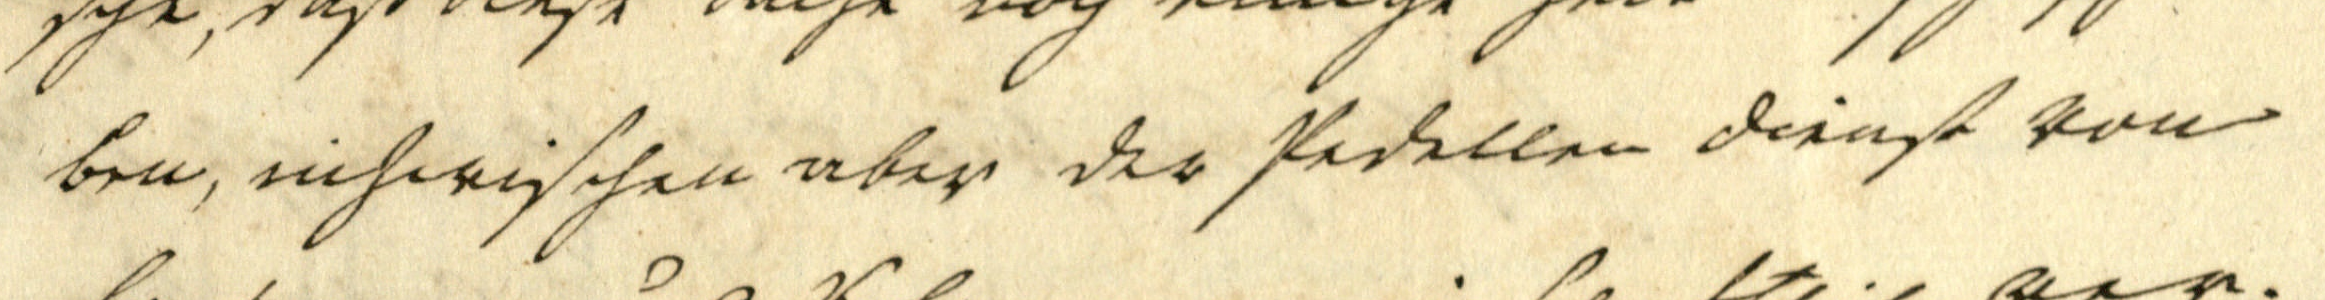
ben, inzwischen aber der Pedellen dienst von
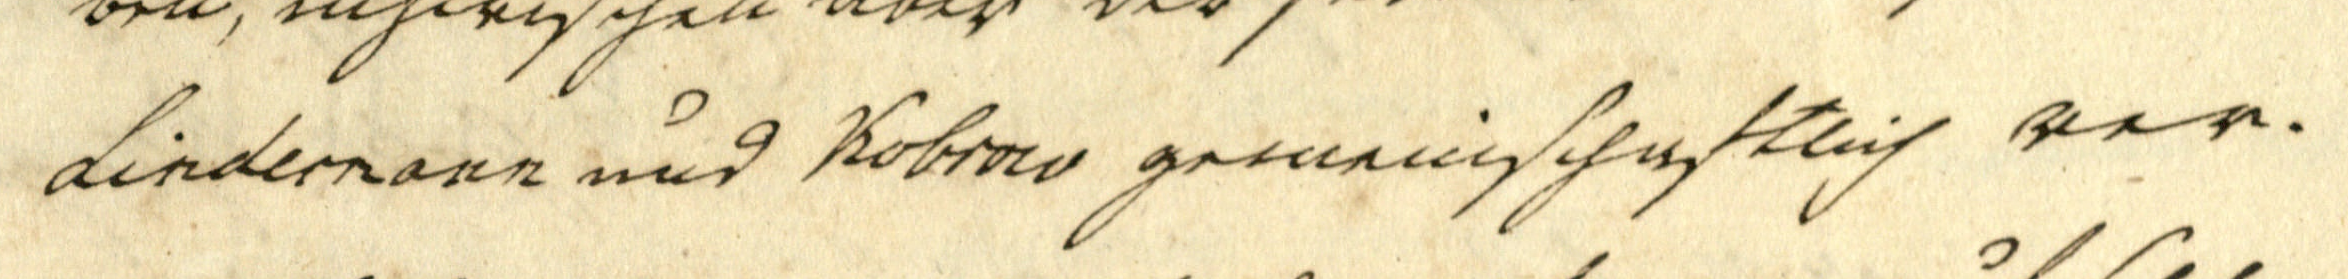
Lindemann und Kobrow gemeinschaftlich ver¬
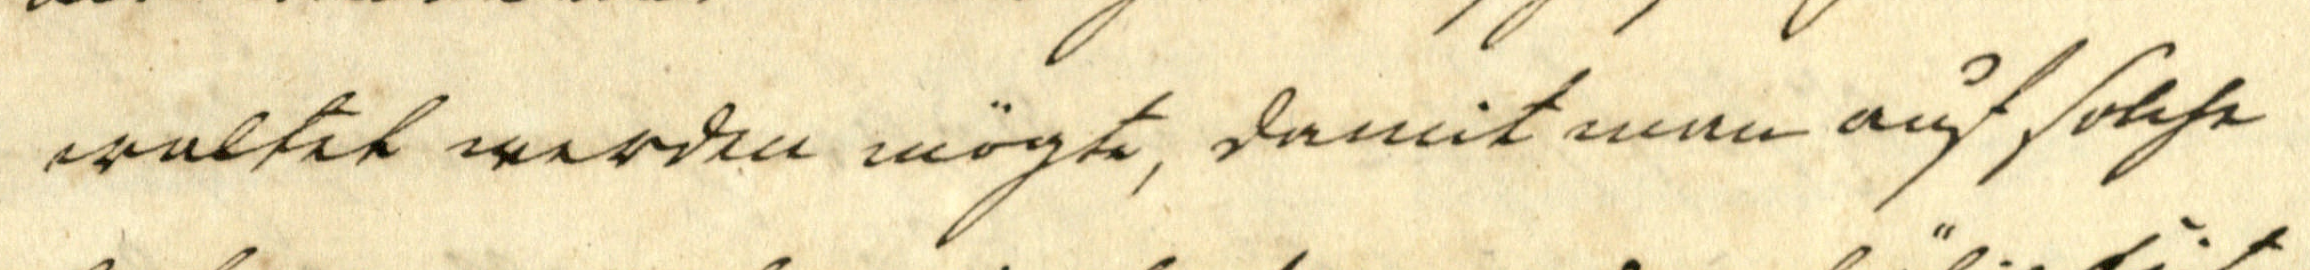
waltet werden mögte, damit man auf solche
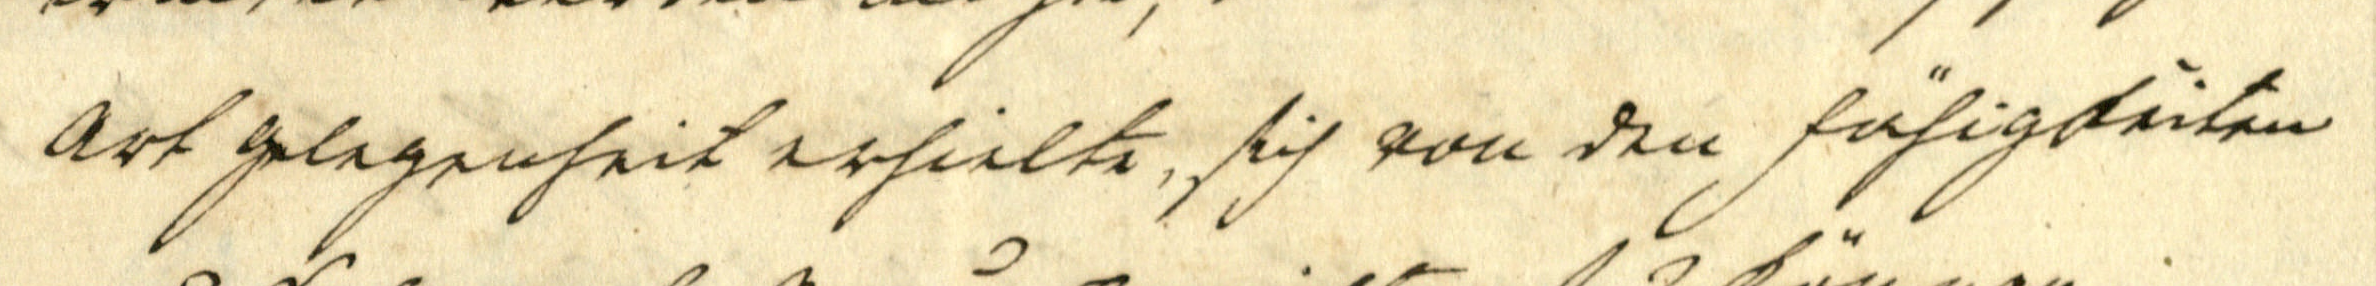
Art Gelegenheit erhielte, sich von den Fähigkeiten
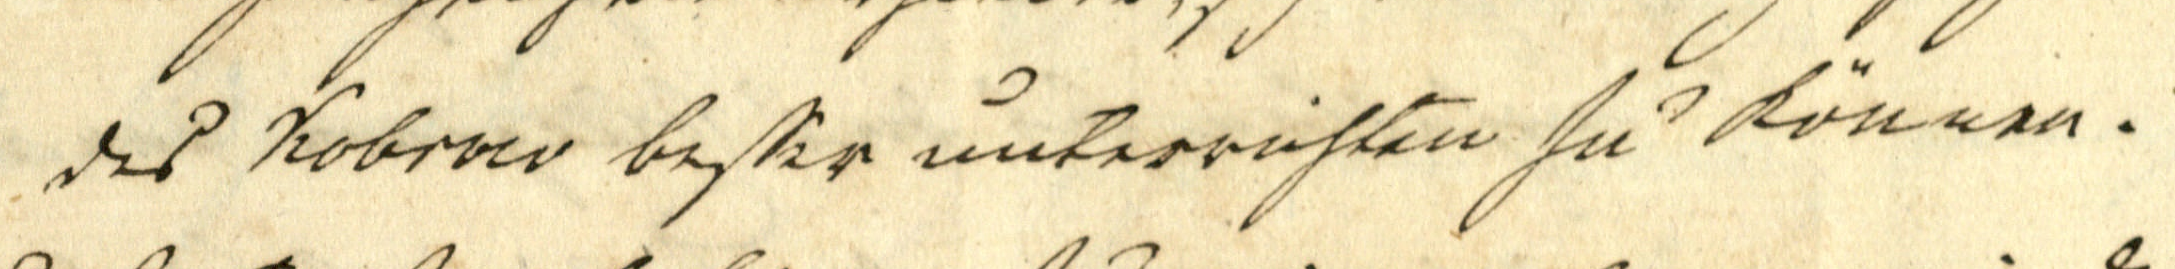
des Kobrow besser unterrichten zu können.
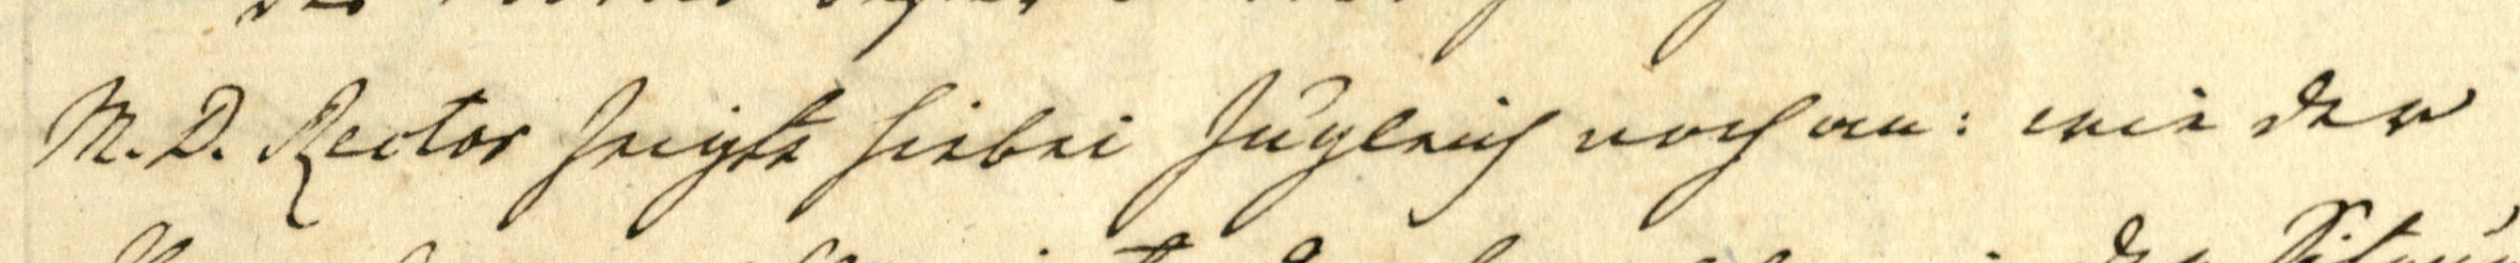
M. D. Rector zeigte hiebei zugleich noch an: wie der
